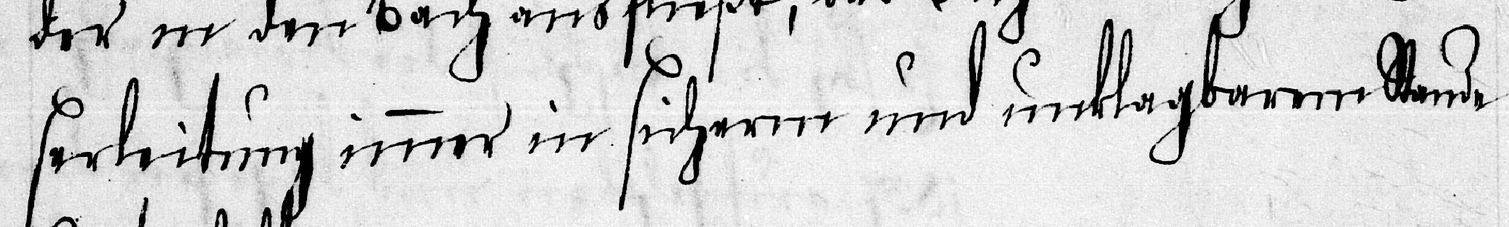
erleitung immer in sicherm und unklagbarem Stande
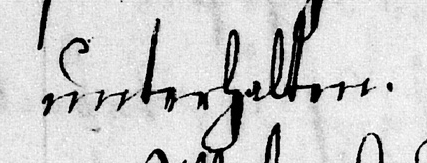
unterhalten.
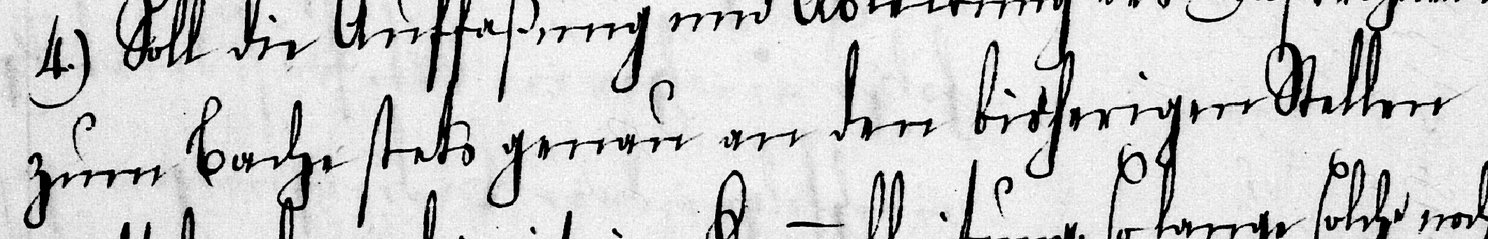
zum Bache stets genau an den bisherigen Stellen
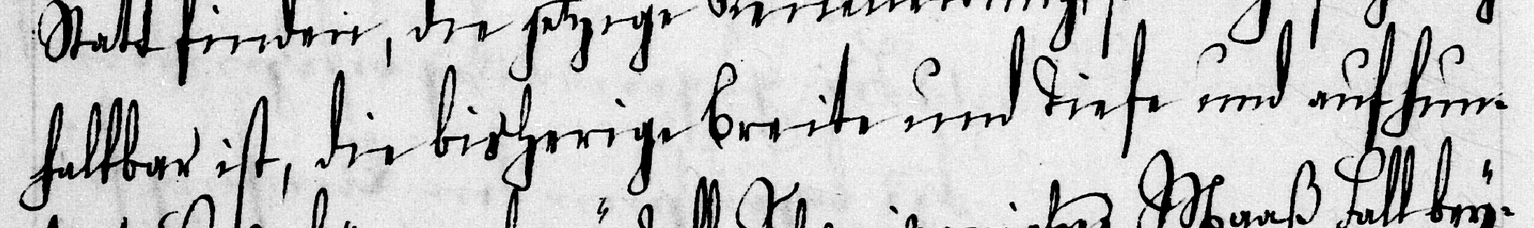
haltbar ist, die bisherige Breite und Tiefe und auf hun¬
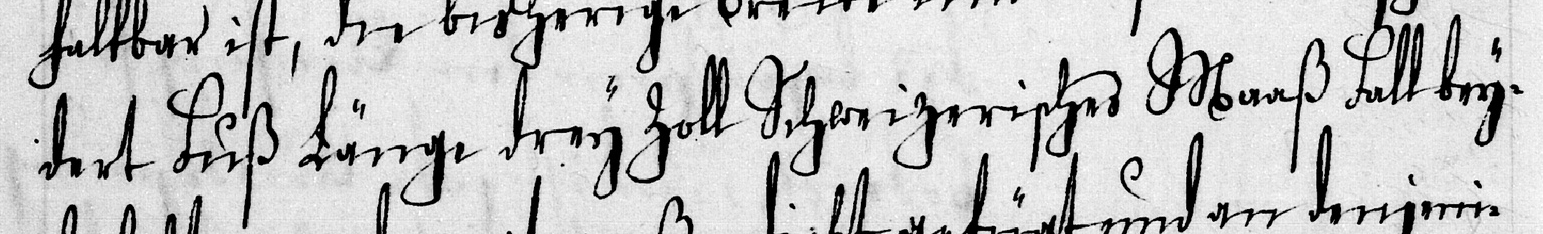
dert Fuß Länge drey Zoll Schweizerisches Maaß Fall bey¬
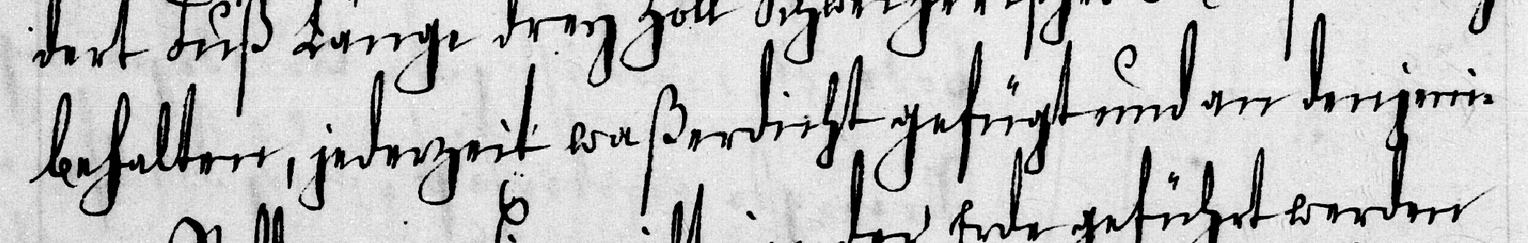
behalten, jederzeit waßerdicht gefügt und an denjeni¬
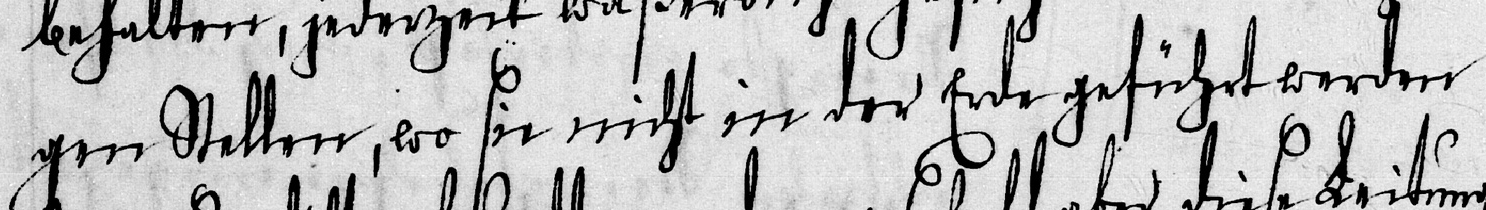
gen Stellen, wo sie nicht in der Erde geführt werden
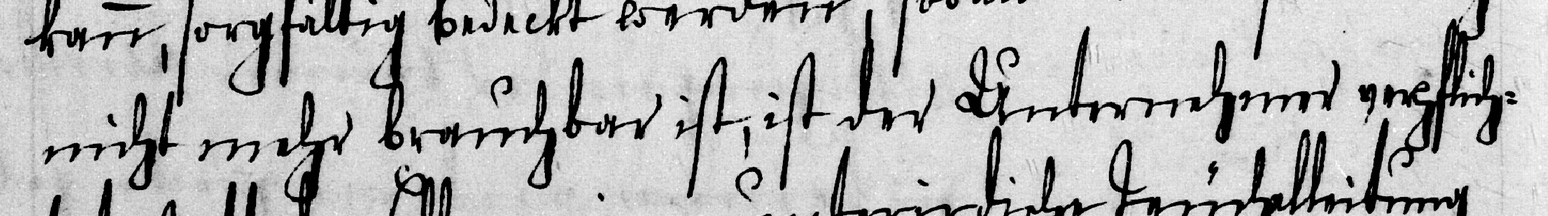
nicht mehr brauchbar ist, ist der Unternehmer verpflic¬
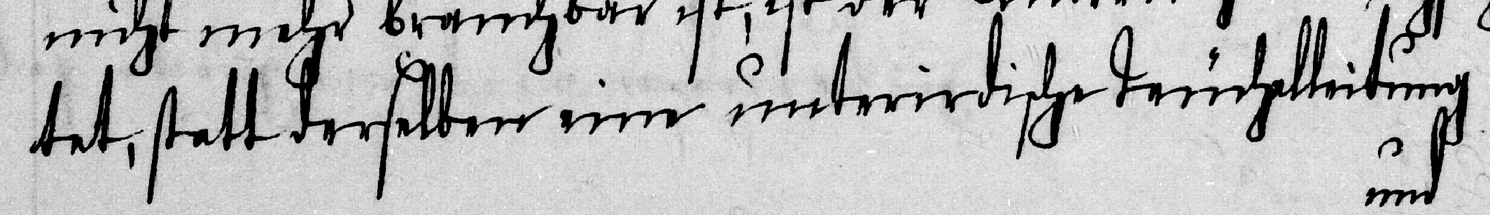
htet, statt derselben eine unterirdische Teuchelleitung
